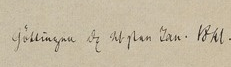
Göttingen den 21sten Jan. 1841.
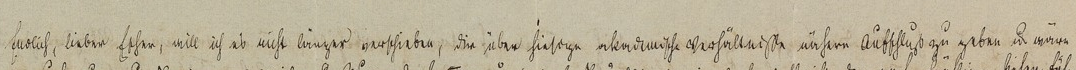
Endlich, lieber Escher, will ich es nicht länger verschieben, dir über hiesige akademische Verhältnisse nähern Aufschluß zu geben u. wäre
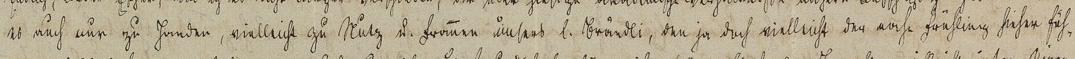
es auch nur zu Handen, vielleicht zu Nutz u. Frommen unsers l. Brändli, den ja doch vielleicht der nahe Frühling hieher füh-
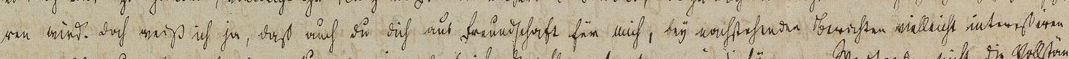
ren wird. Doch weiß ich ja, daß auch du dich aus Freundschaft für mich, bey nachstehenden Berichten vielleicht interessiren
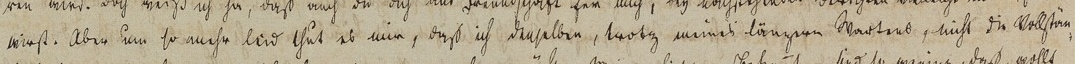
wirst. Aber um so mehr leid thut es mir, daß ich denselben, trotz meines längern Wartens, nicht die Vollstän-
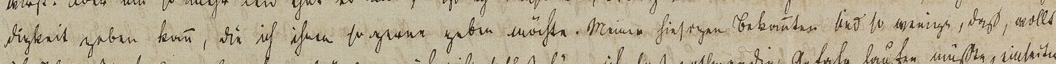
digkeit geben kann, die ich ihnen so gerne geben möchte. Meiner hiesigen Bekannten sind so wenige, daß, wollt
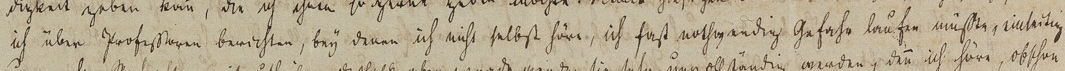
ich über Professoren berichten, bey denen ich nicht selbst höre, ich fast nothwendig Gefahr laufen müßte, einseitig-
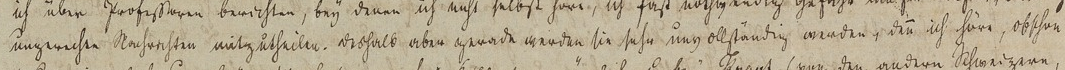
ungerechte Nachrichten mitzutheilen. Deshalb aber gerade werden sie sehr unvollständig werden, denn ich höre, obschon
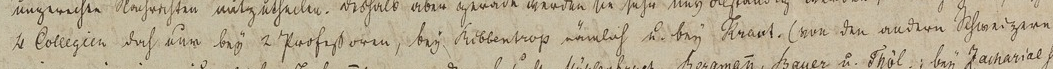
4 Collegien doch nur bey 2 Professoren, bey Ribbentrop nämlich u. bey Kraut (von den andern Schweizern,
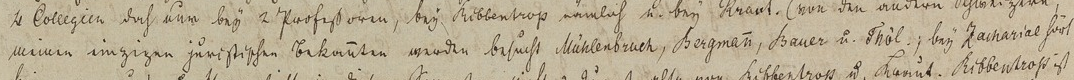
meinen einzigen juristischen Bekannten werden besucht Mühlenbruch , Bergmann , Bauer u. Thöl ; bey Zachariae hört
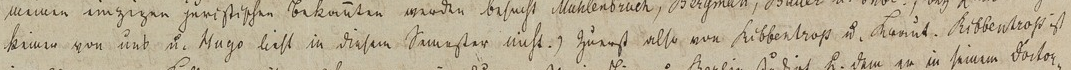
keiner von uns u. Hugo liest in diesem Semester nicht.) Zuerst also von Ribbentrop u. Kraut.Ribbentrop ist
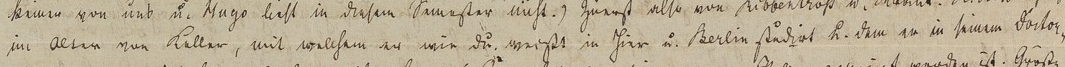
im Alter von Keller, mit welchem er wie du weißt in Hier u. Berlin studirt u. dem er in seinem Doctor-
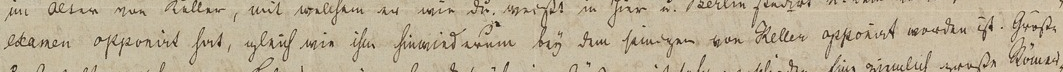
examen opponirt hat, gleich wie ihm hinwiederum bey dem seinigen von Keller opponirt worden ist. Größe
